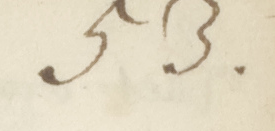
53.
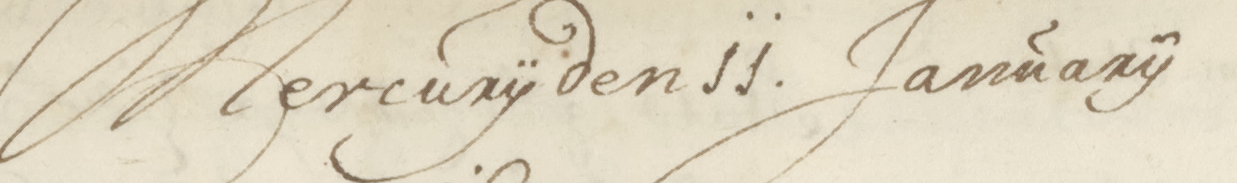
Mercurij den 11. Januarij
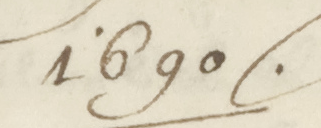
1690.
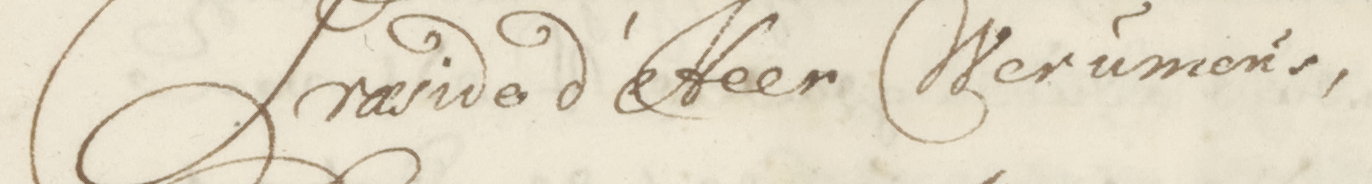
Præside d'Heer Werumeus,
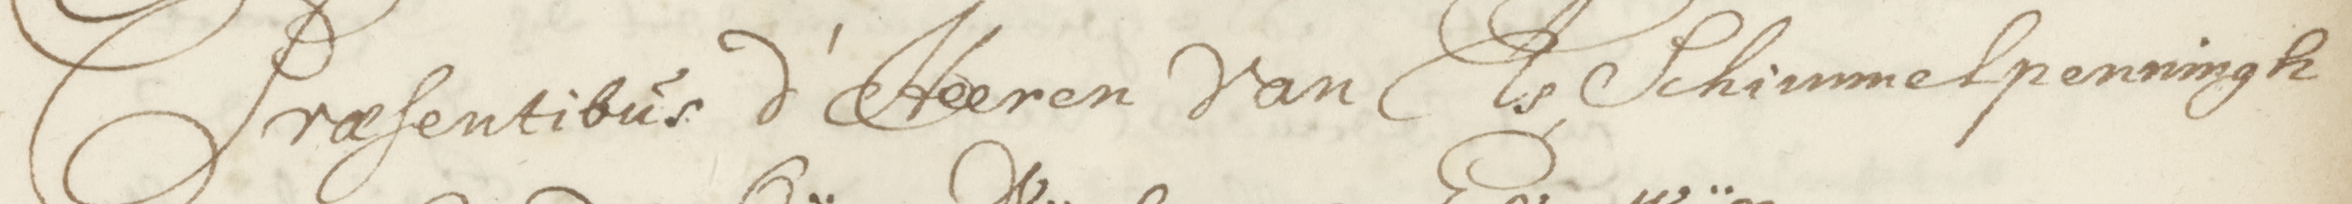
Præsentibus d'Heeren van Els Schimmelpenningh
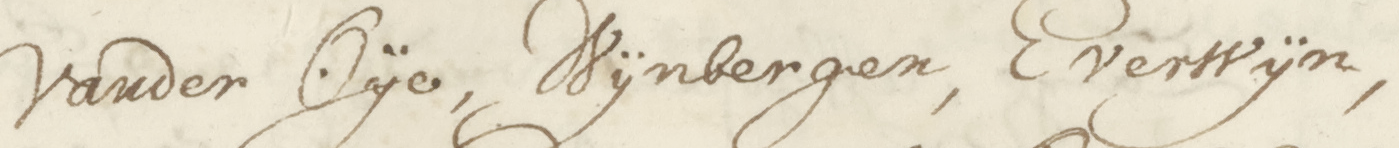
Vander Oije, Wijnbergen, Everwijn
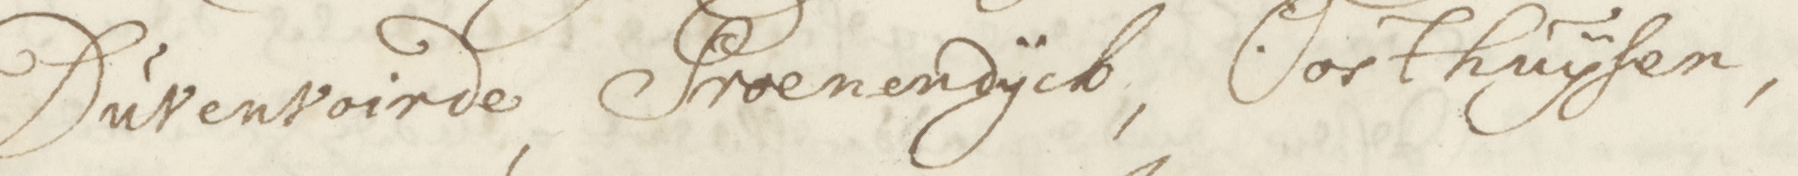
Duvenvoirde, Groenendijck, Oosthuijsen,
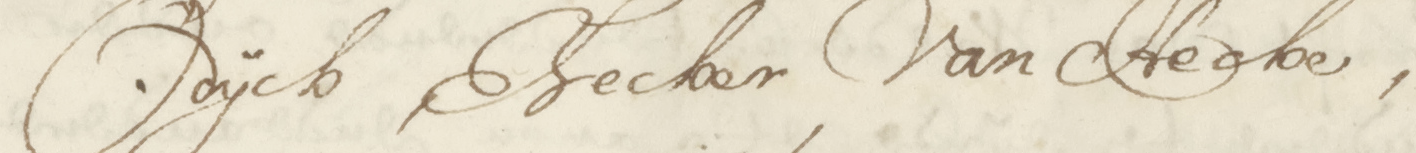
Odijck, Becker, van Hecke,
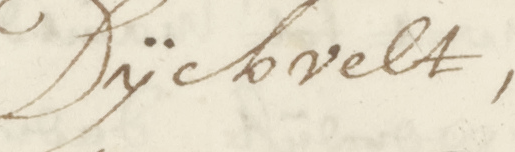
Dijckvelt
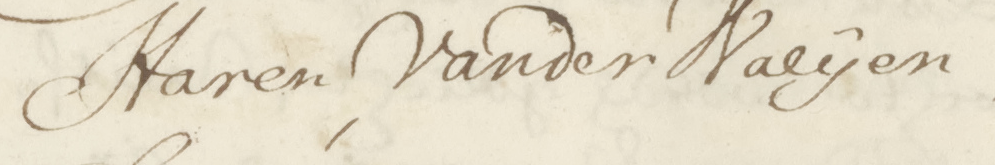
Haren vanden Waeijen
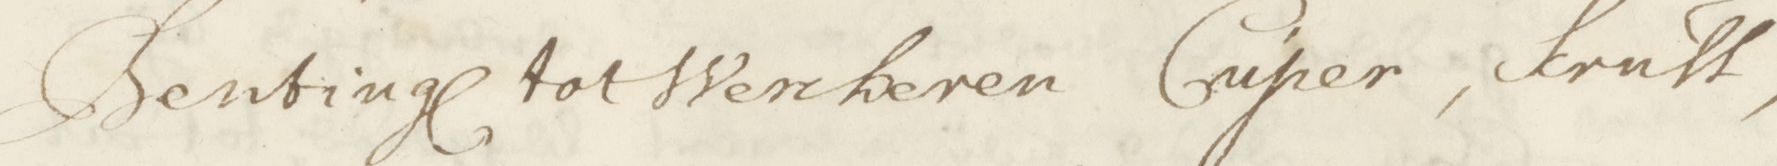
Bentingh tot Werckeren, Cuper, Krull
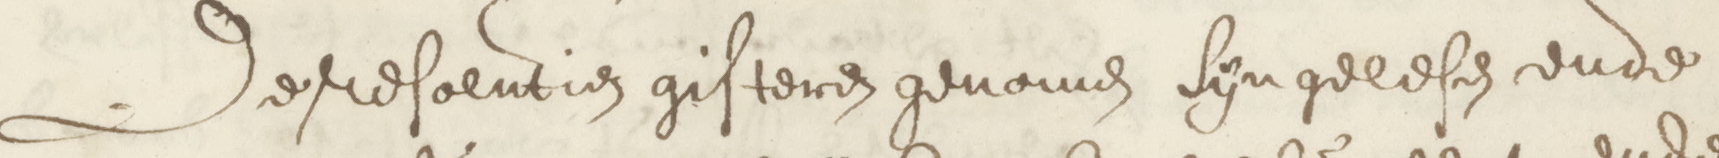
De resolutien gisteren genomen sijn gelesen ende
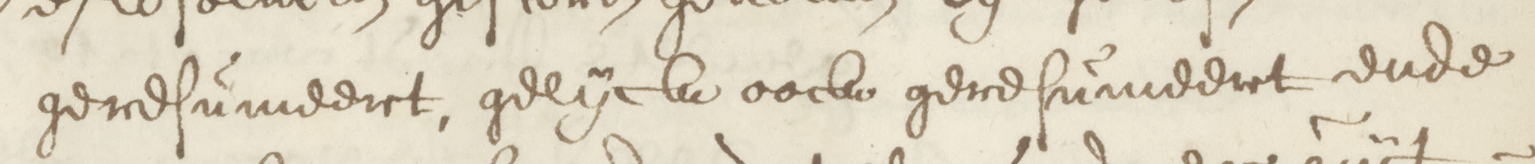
geresumeert, gelijck oock geresumeert ende
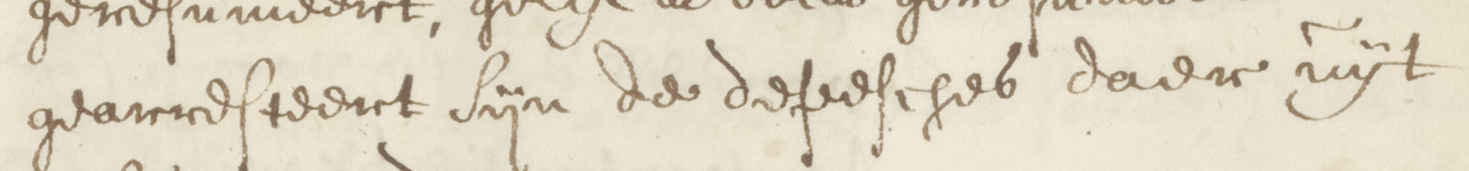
gearresteert sijn de depesches daer uijt
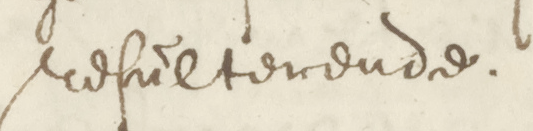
resulterende.
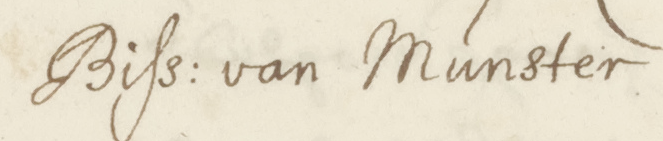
Biss: van Munster,
